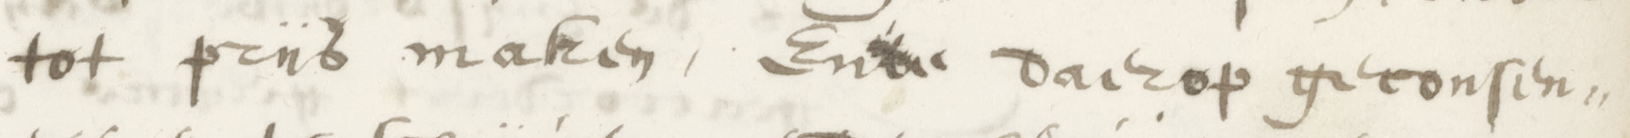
tot prijs maken. Ende daerop geconsen„
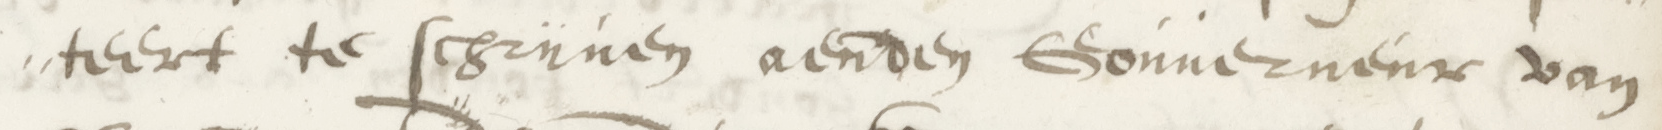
,,teert te scryuen aenden Gouuerneur van
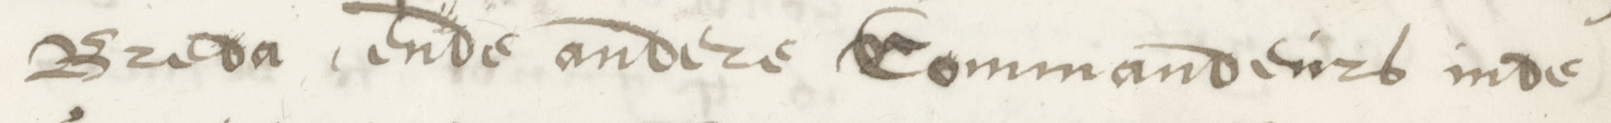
Breda, ende andere Commandeurs inde
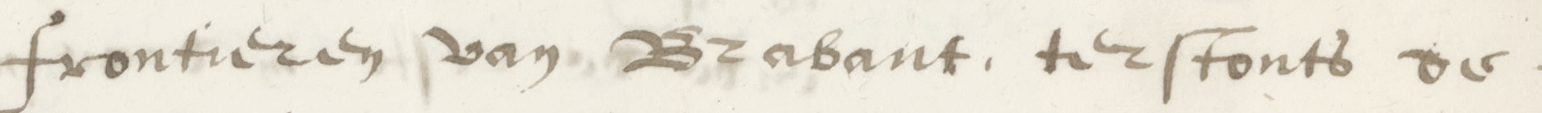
frontieren van Brabant, terstonts de
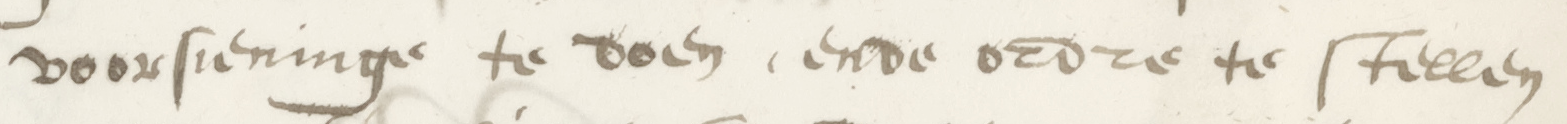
voorsieninge te doen, ende ordre te stellen
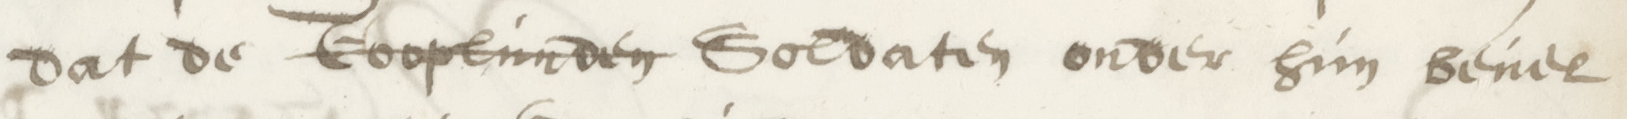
dat de Coopluyden Soldaten onder hun beuel
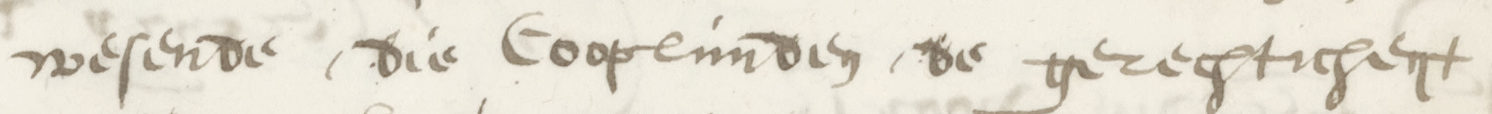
wesende, die Coopluyden, de gerechticheyt
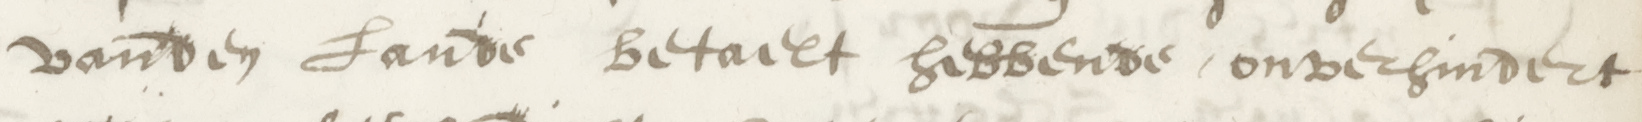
vanden Lande betaelt hebbende, onverhindert
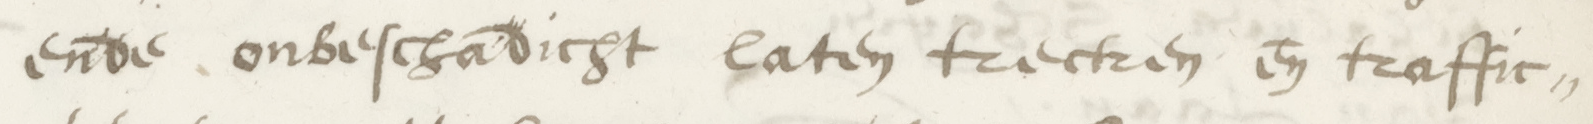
ende onbeschadicht laten trecken en traffic,,
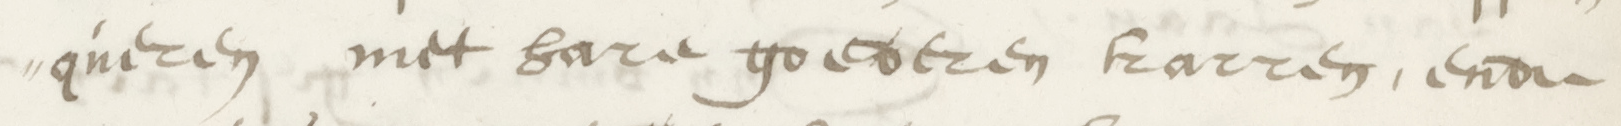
,,queren met hare goederen karren, ende
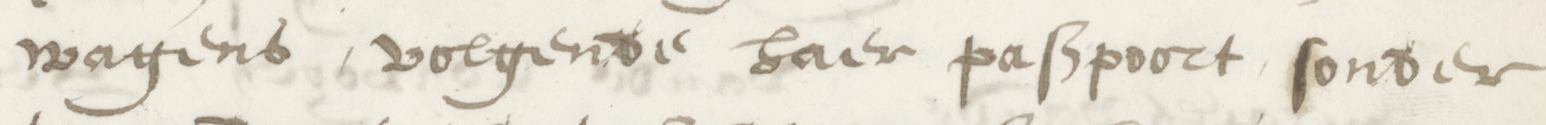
wagens, volgende haer passpoort, sonder
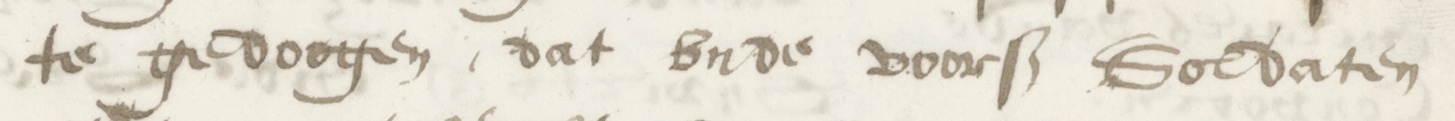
te gedoogen, dat byde voors Soldaten
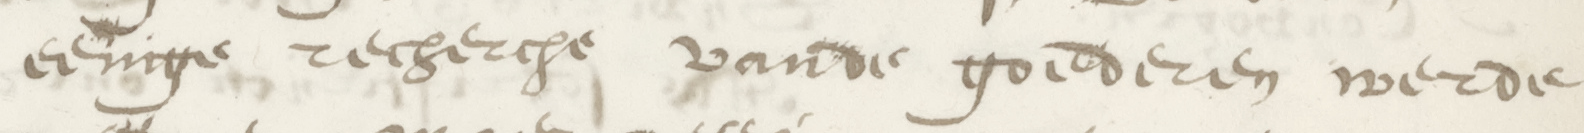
eenige recherche vande goederen werde
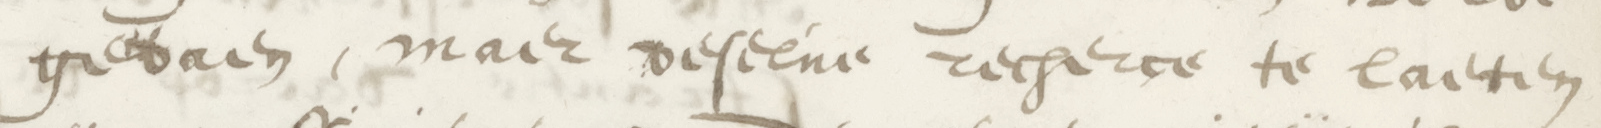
gedaen, maer deselue recherce te laeten
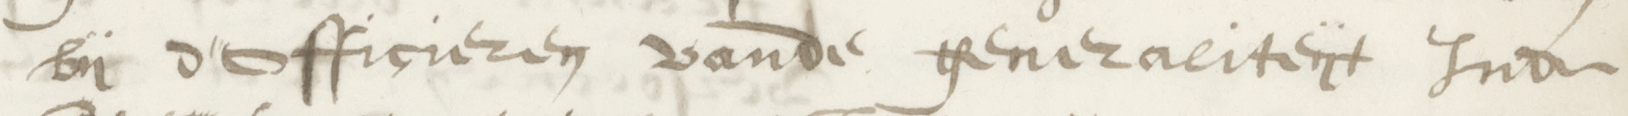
bij d'Officieren vande generaliteijt Inde
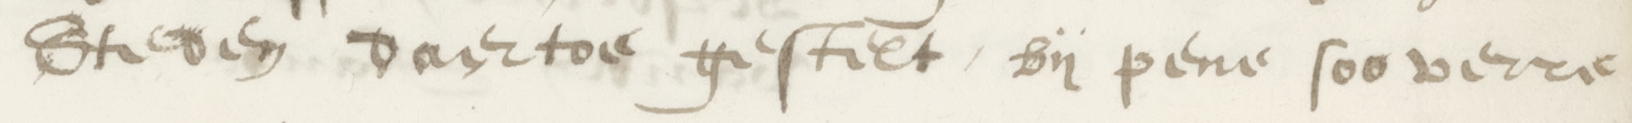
Steden daertoe gestelt, bij pene soo verre
